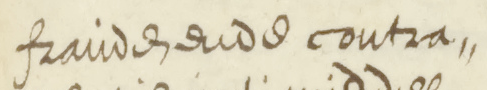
frauden ende contra„
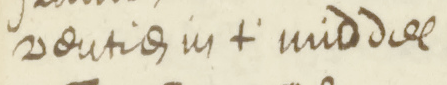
ventien in t' middel
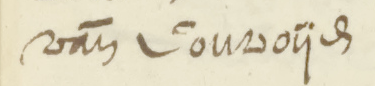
van Convoijen
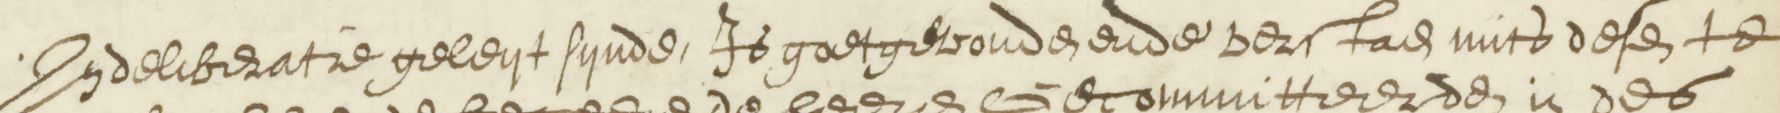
In deliberatie geleyt synde, Is goetgevonden ende verstaen mits desen te
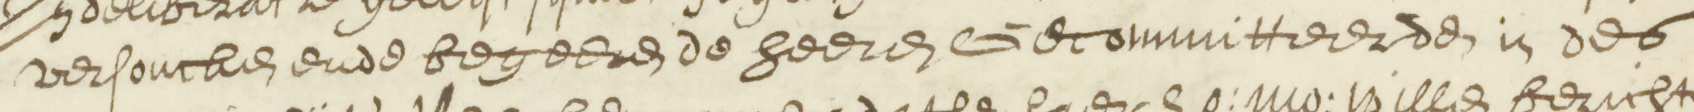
versoucken ende begeeren de heeren Gecommitteerden in des
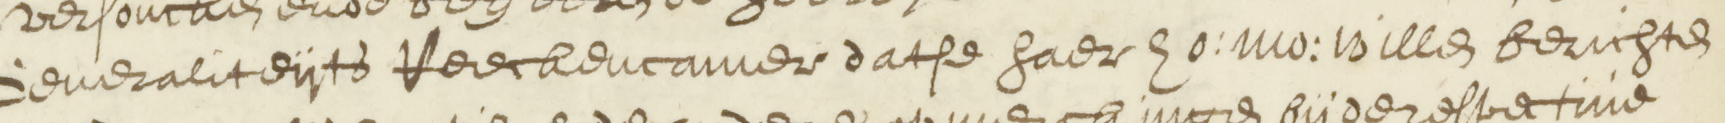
Generaliteijts Reeckencamer datse haer ho:mo: willen berichten
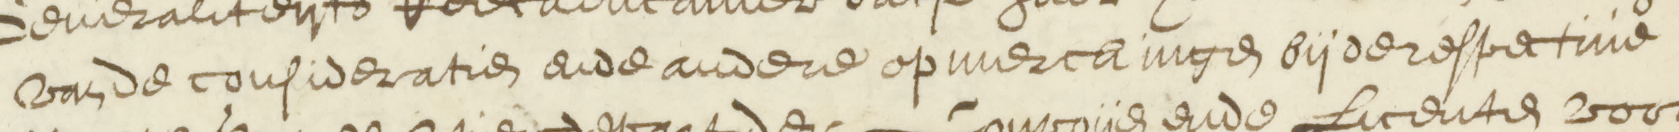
vande consideratien ende andere opmerckingen bij de respectiue
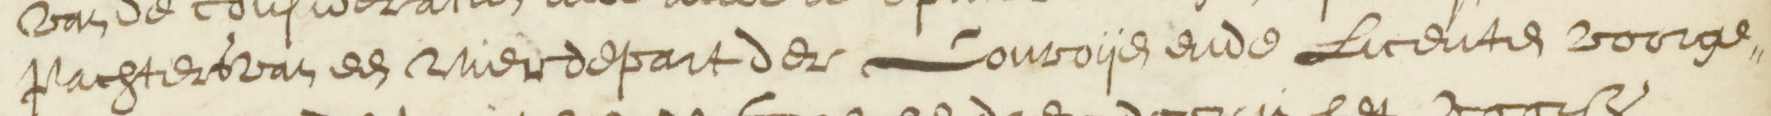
Pachters van een vierdepart der Convoijen ende Licenten voorge„
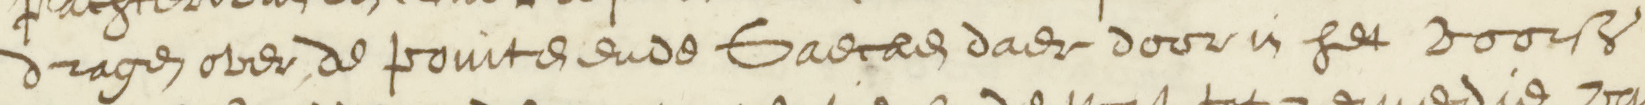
dragen over de pointen ende Saecken daer door in het voors
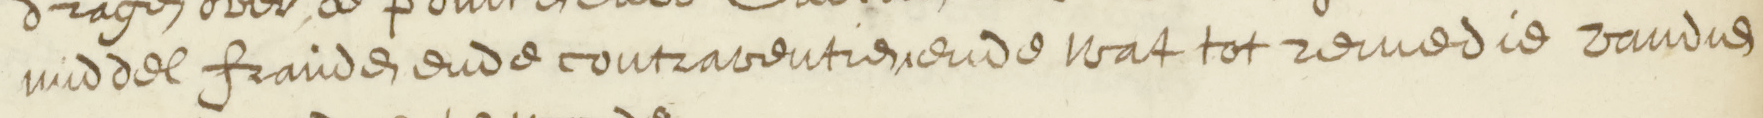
middel frauden ende contraventien, ende wat tot remedie vandien
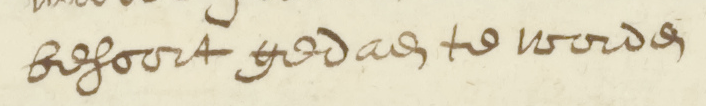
behoort gedaen te worden.
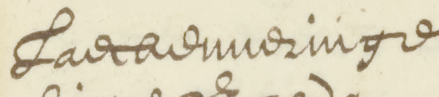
Laeckenneringe
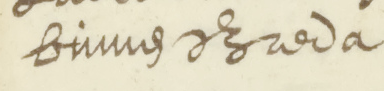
binnen Breda
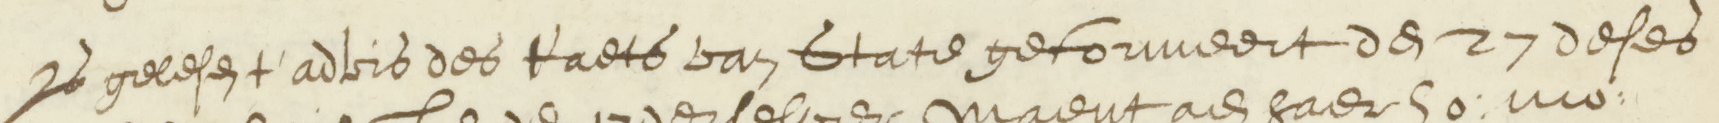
Is gelesen t‛ advis des Raets van State geformeert den 27 deses
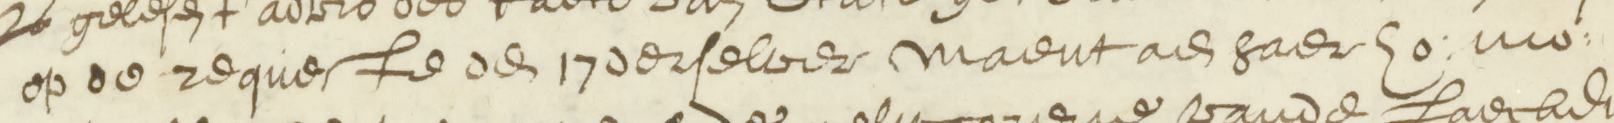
op de requeste den 17 derselver maent aen haer ho:mo:
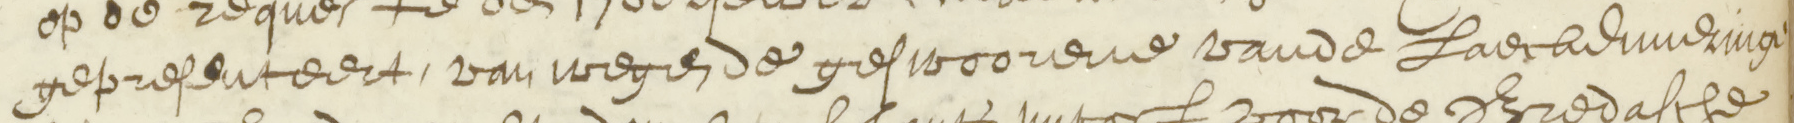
gepresenteert, van wegen de geswoorene vande Laeckenneringe
